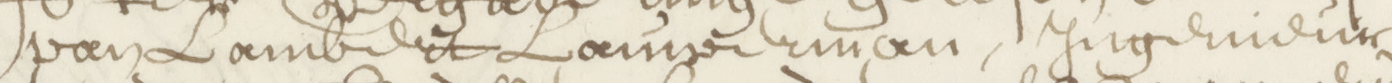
van Lambert Lauwerman, Ingenieur
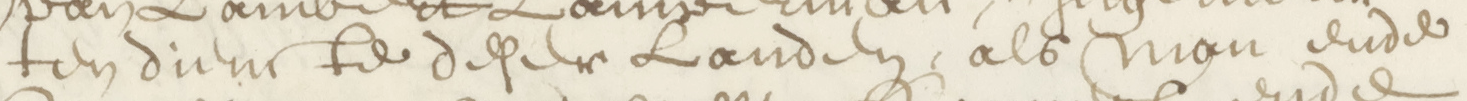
ten dienste deser Landen, als man ende
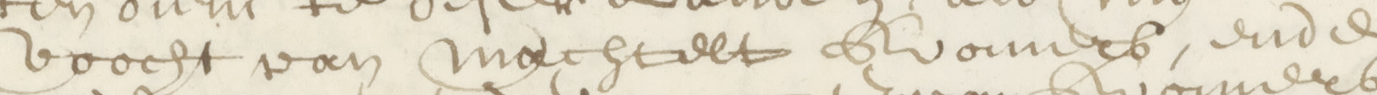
voocht van machtelt Romers, ende
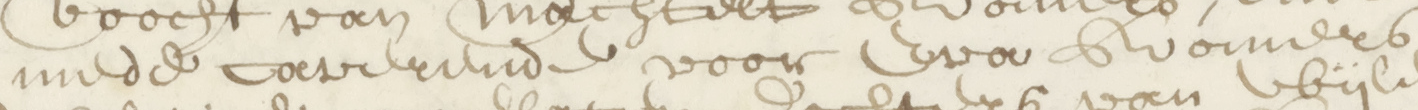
mede caverende voor Eva Romers,
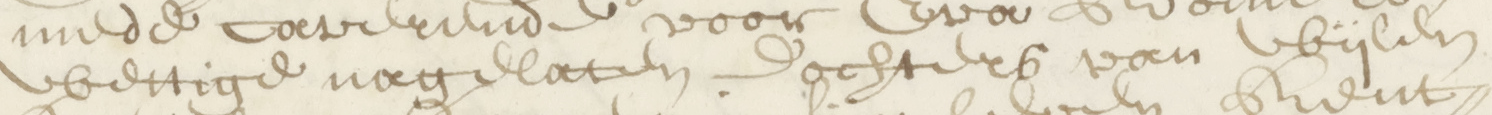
wettige nagelaten Dochters van wijlen
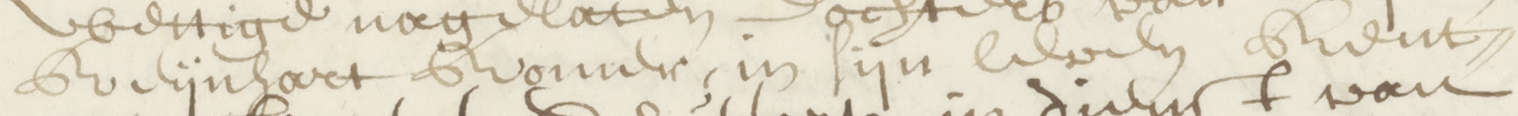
Reijnhart Romer, in sijn leven Rent,,
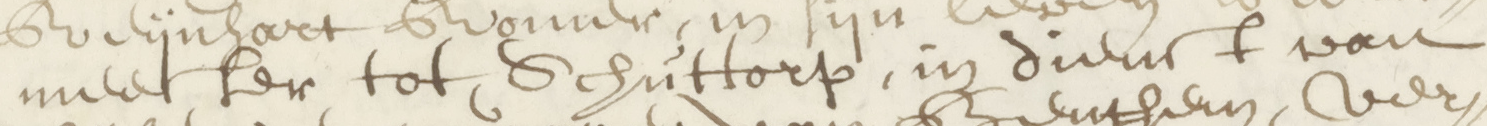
meester tot Schuttorp, in dienst van
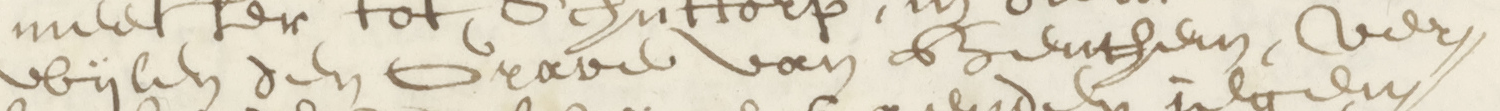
wijlen den Grave van Benthem, ver,,
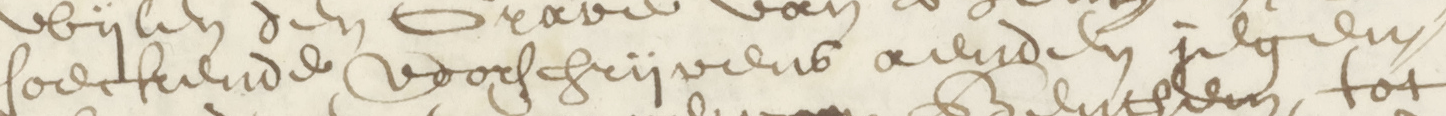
soeckende voorschrijvens aenden jegen,,
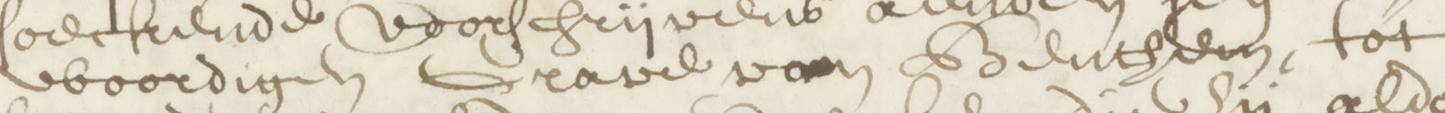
woordigen Grave van Benthem, tot
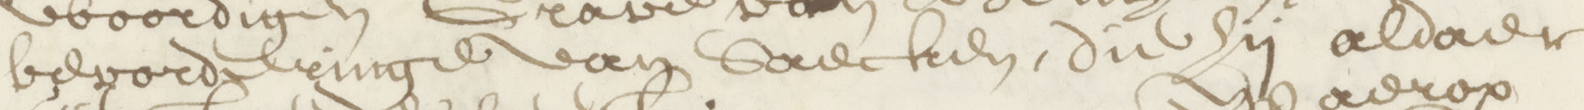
bevorderinge van saecken, die hij aldaer
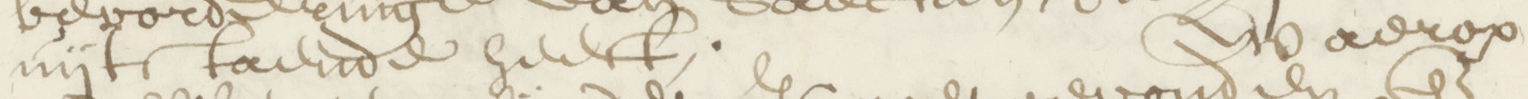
uijtstaende heeft; Waerop
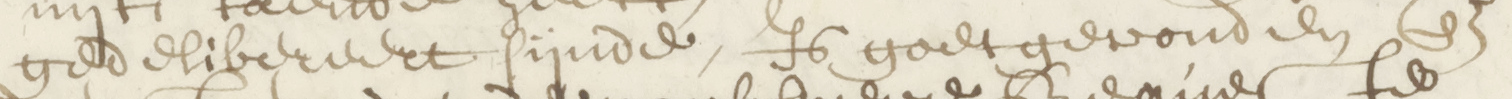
gedelibereert sijnde, Is goetgevonden &
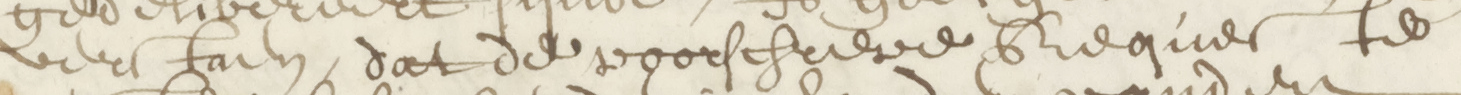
verstaen, dat de voorschreve Requeste
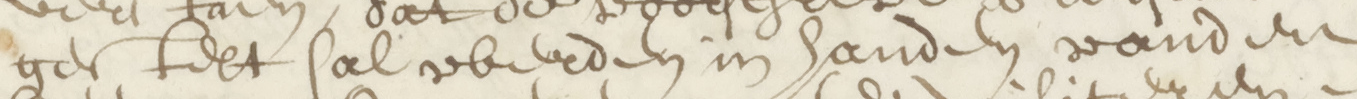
gestelt sal werden in handen vanden
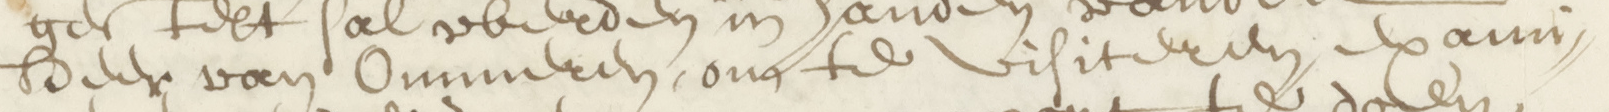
Heer van Ommeren, om te visiteren, exami,,
